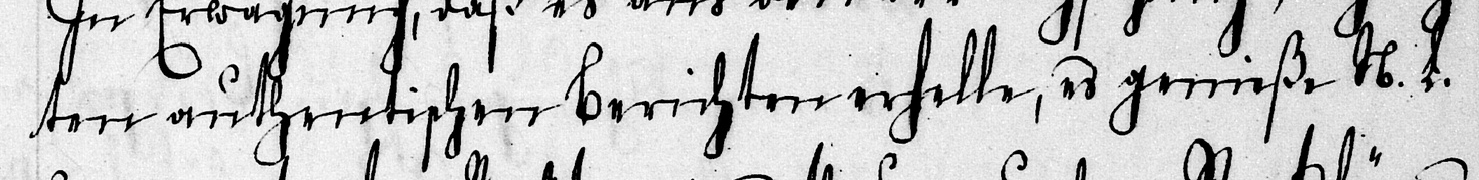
ten authentischen Berichten erhelle, es genieße N. L.
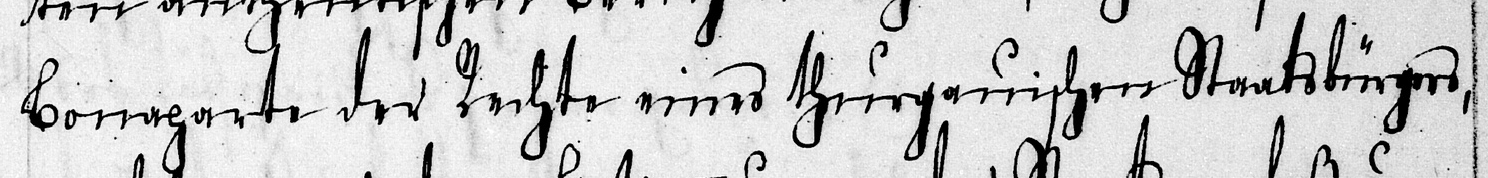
Bonaparte der Rechte eines thurgauischen Staatsbürgers,
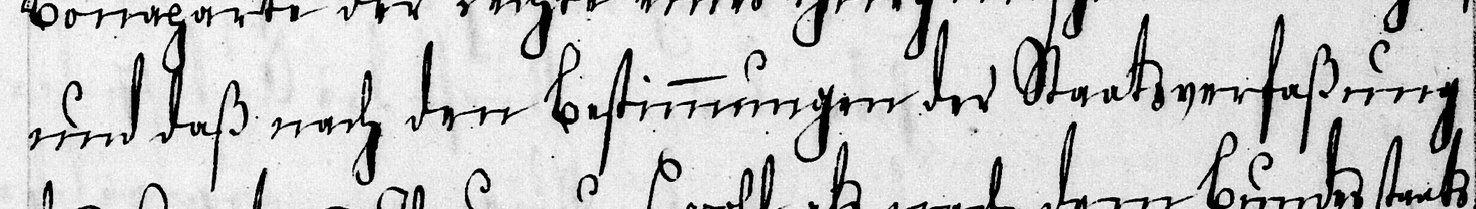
und daß nach den Bestimmungen der Staatsverfaßung,
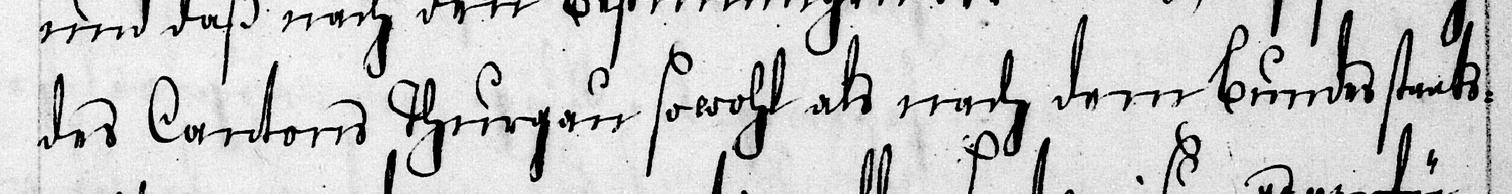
des Cantons Thurgau sowohl als nach dem Bundesstaat¬
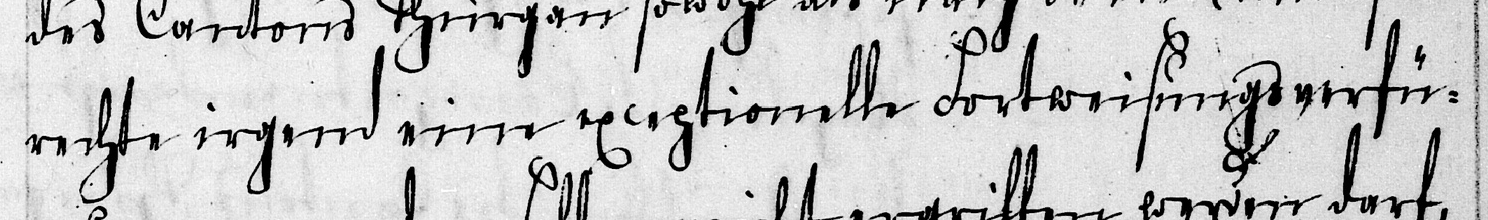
srechte irgend eine exceptionelle Fortweisungsverfü¬
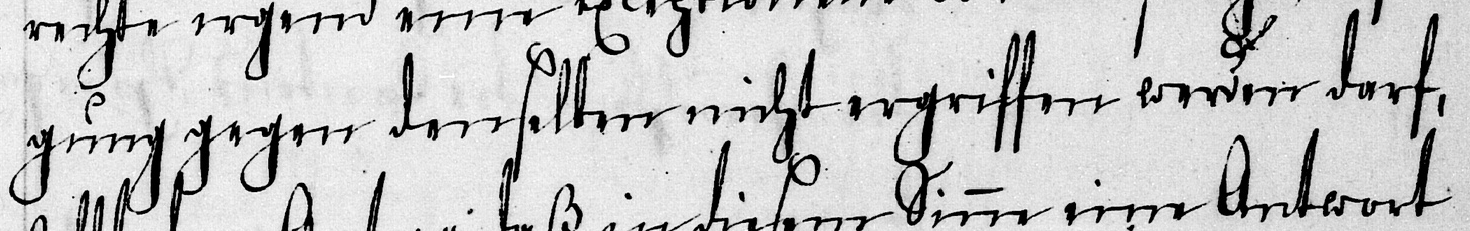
gung gegen denselben nicht ergriffen werden darf,
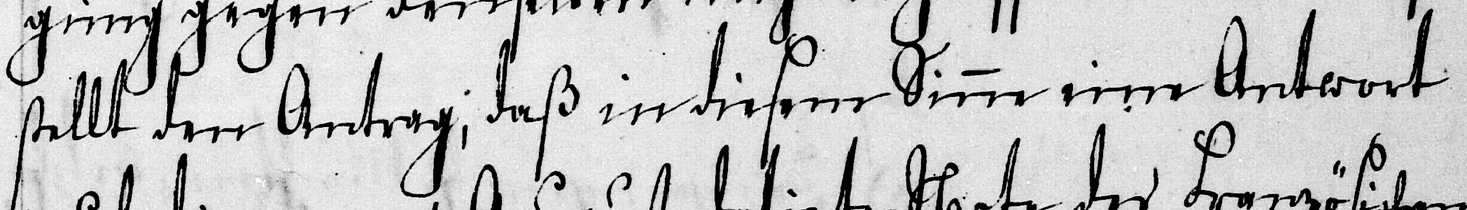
tellt den Antrag, daß in diesem Sinne eine Antwort
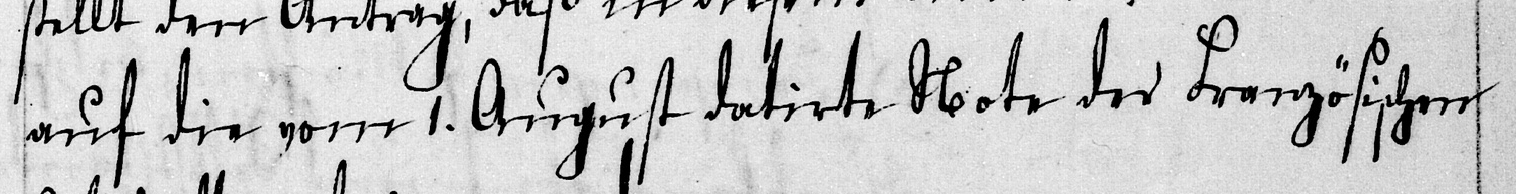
auf die vom 1. August datirte Note der Französischen
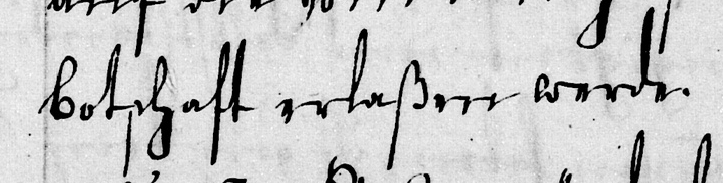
Botschaft erlaßen werde.
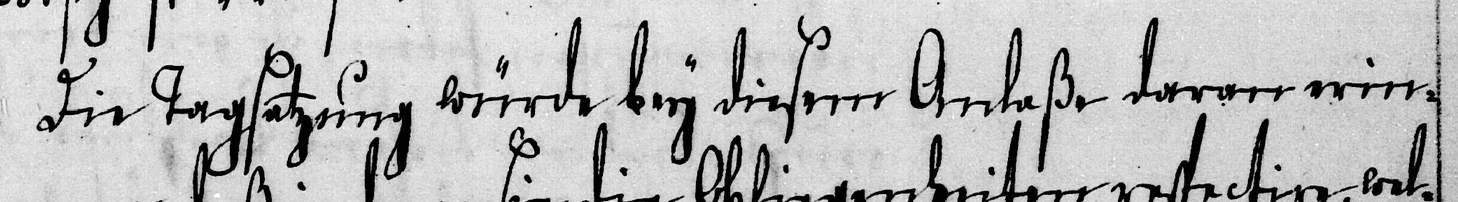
Die Tagsatzung würde bey diesem Anlaße daran erin¬
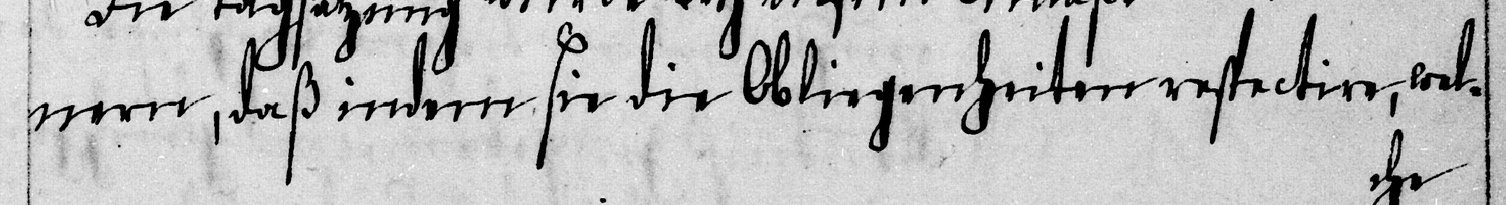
nern, daß indem sie die Obliegenheiten respectire, wel-
